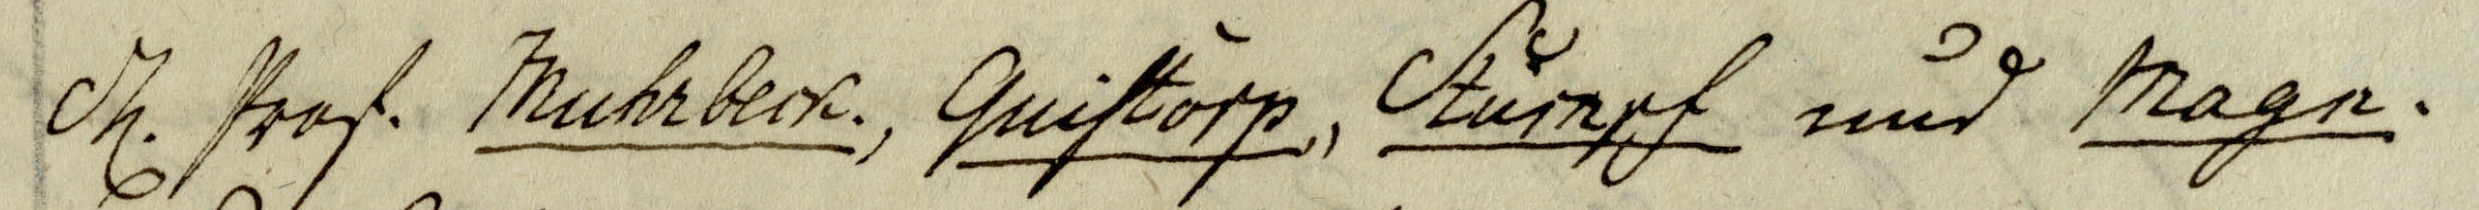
dh. Prof. Muhrbeck., Quistorp, Stumpf und Magn.
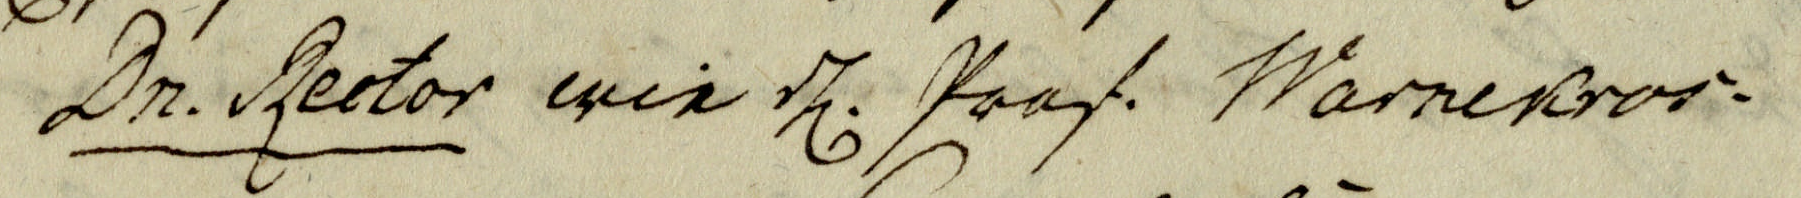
Dn. Rector wie dh. Prof. Warneckros.
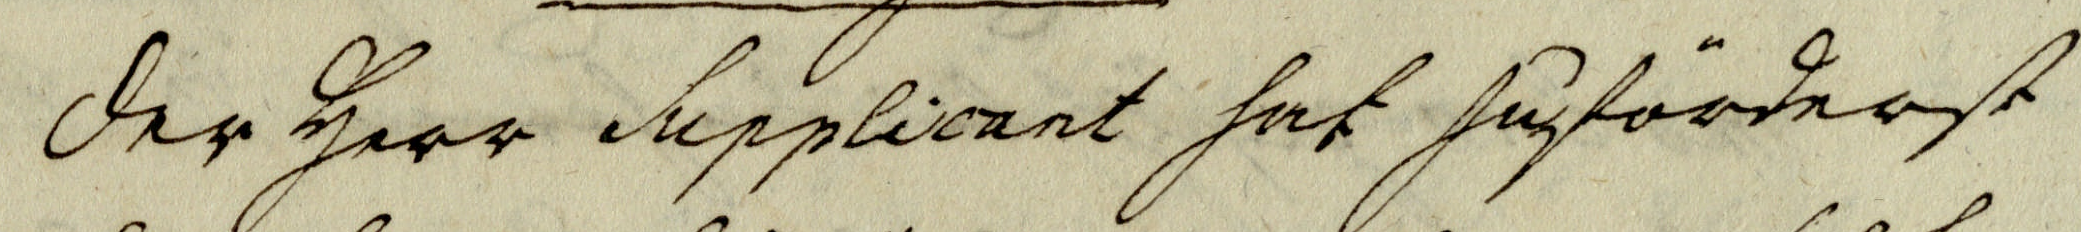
Der Herr Supplicant hat zuförderst
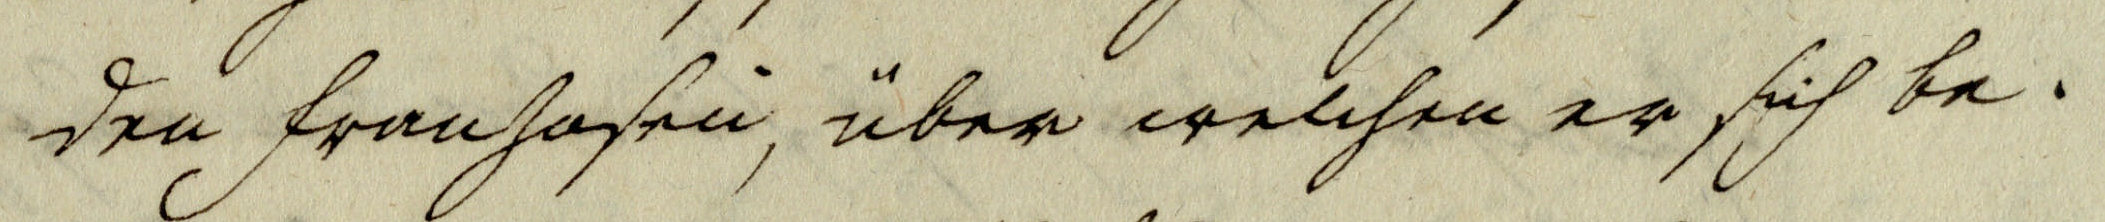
den Franzosen, über welchen er sich be¬
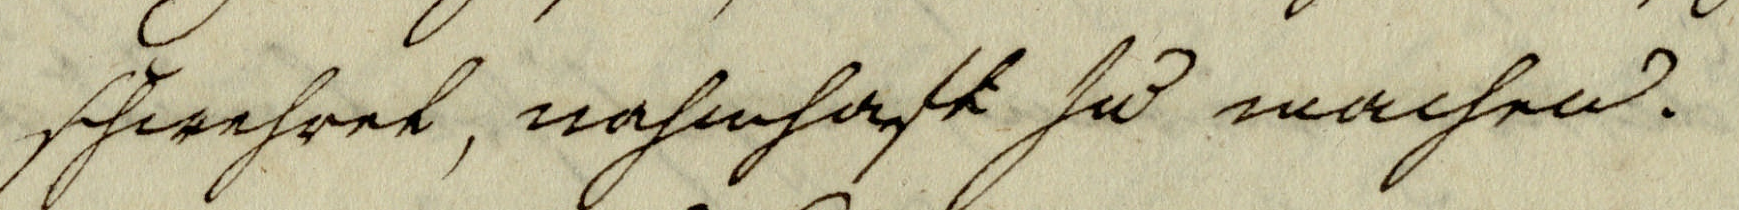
schwehret, nahmhaft zu machen.
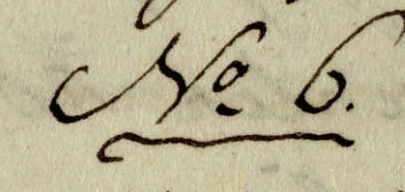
No 6.
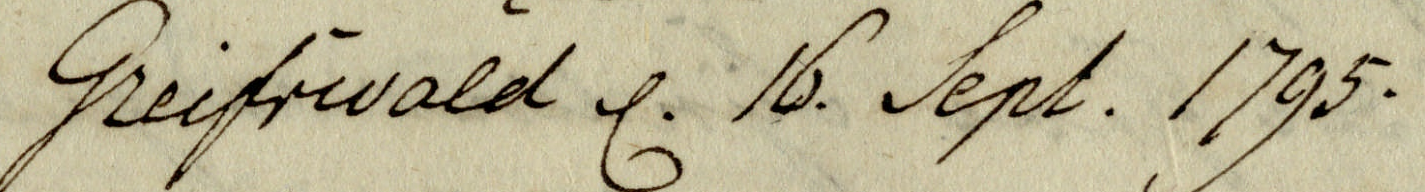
Greifswald d. 16. Sept. 1795.
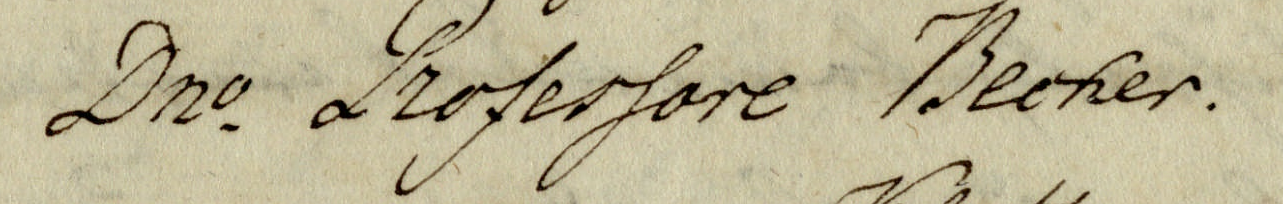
Dno Professore Becker.
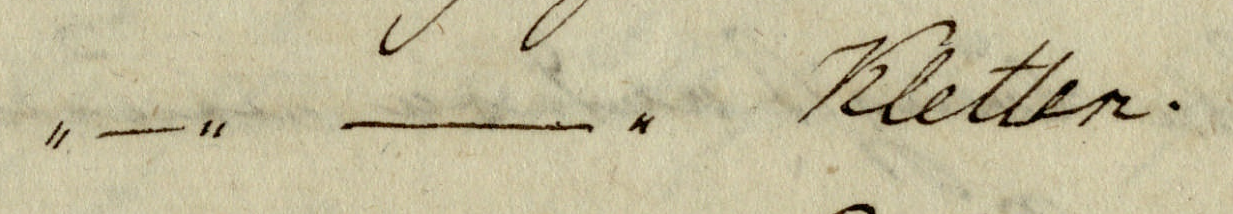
" — " — " Kletten.
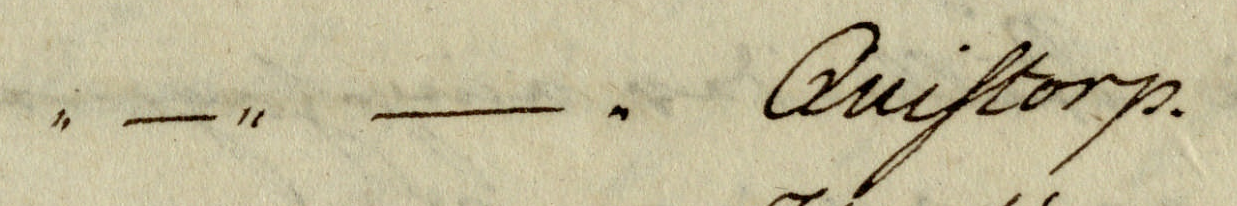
" — " — " Quistorp.
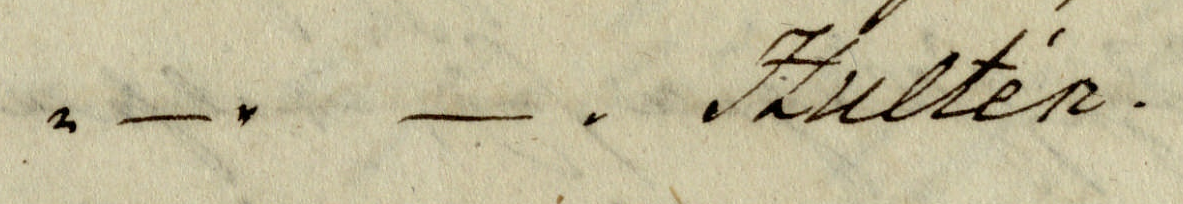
" — " — " Hultén.
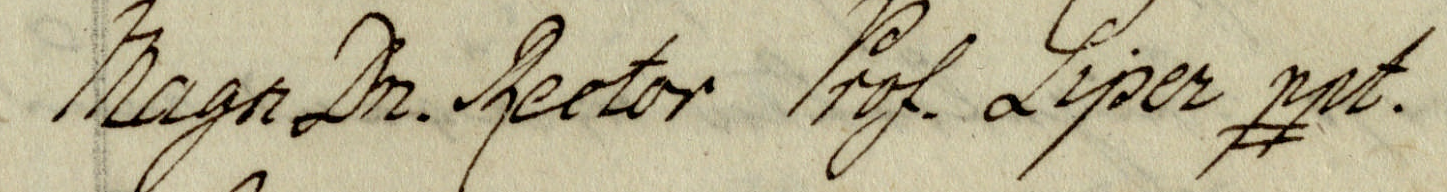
Magn. Dn. Rector Prof. Piper ppt.
